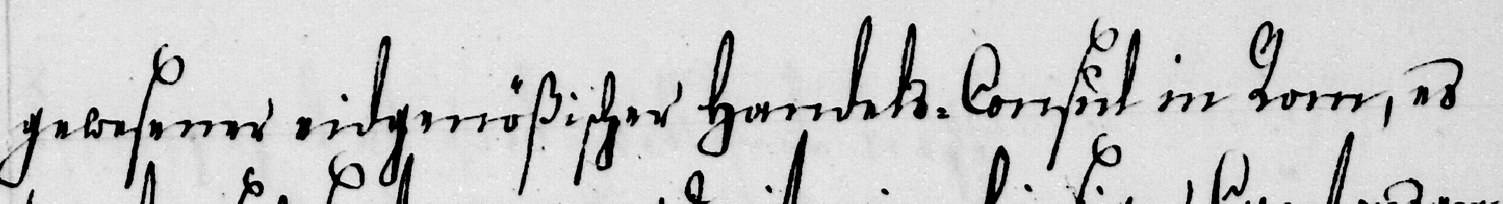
gewesener eidgenößischer Handels-Consul in Rom, es
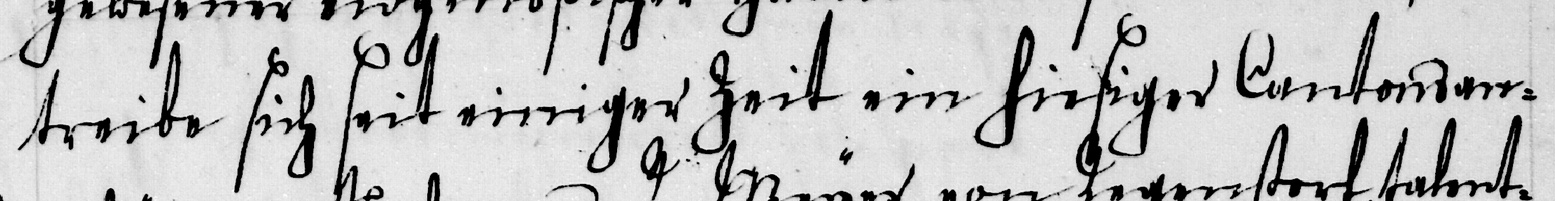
treibe sich seit einiger Zeit ein hiesiger Cantonsan¬
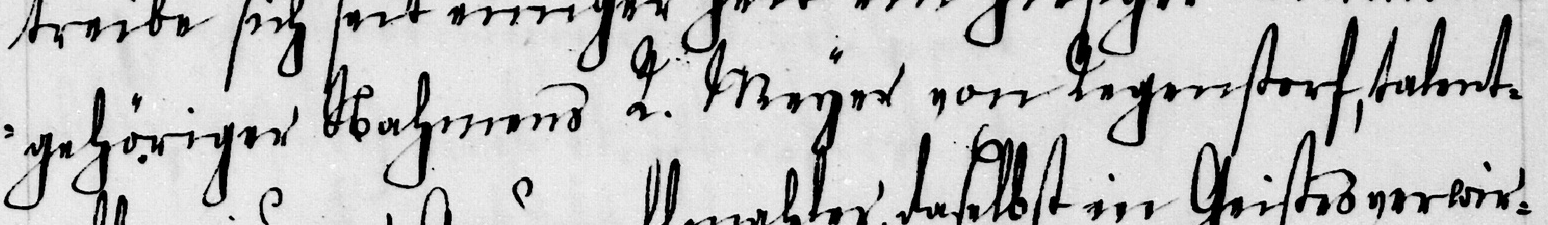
gehöriger Nahmens R. Meyer von Regenstorf, talent¬
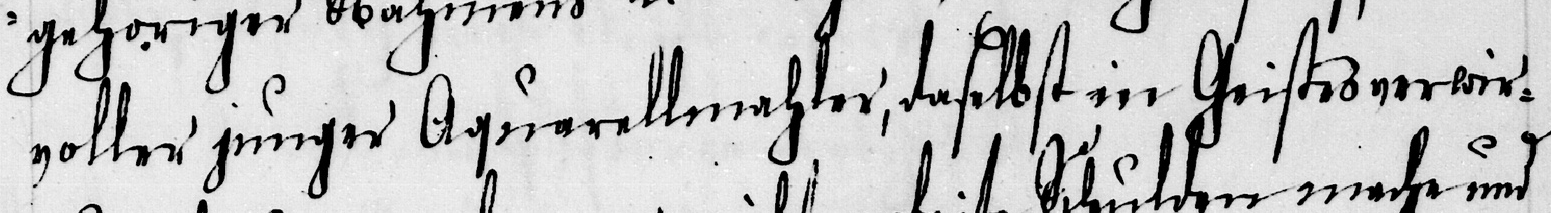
voller junger Aquarellmahler, daselbst in Geistesverwir¬
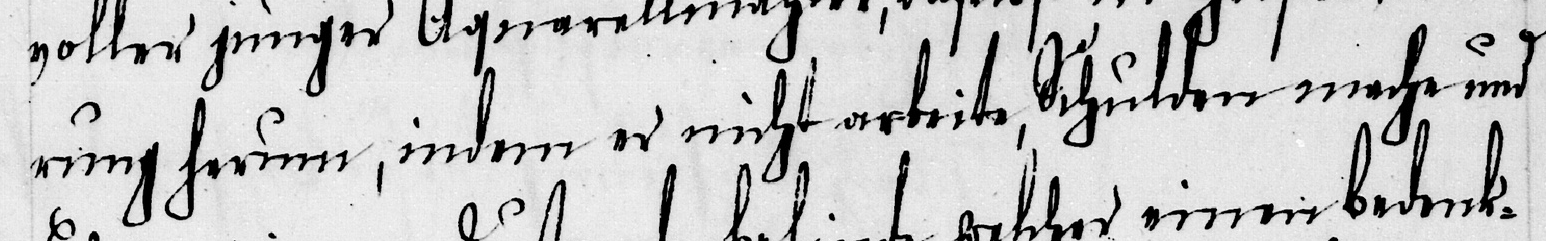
rung herum, indem er nicht arbeite, Schulden mache, und
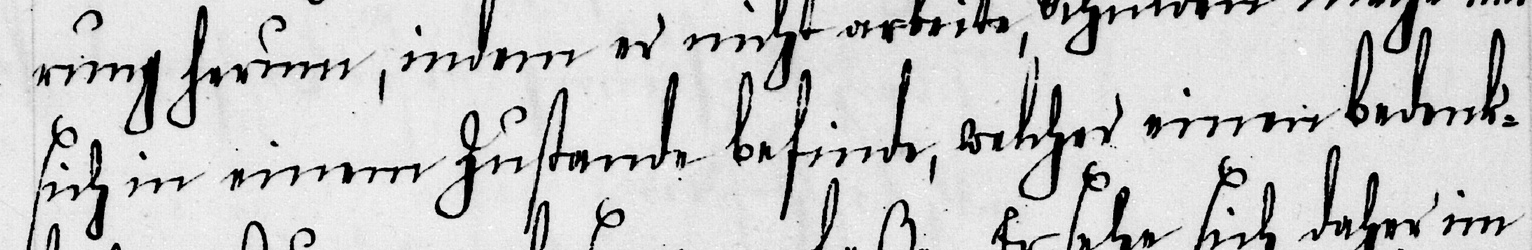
sich in einem Zustande befinde, welcher einen bedenk¬
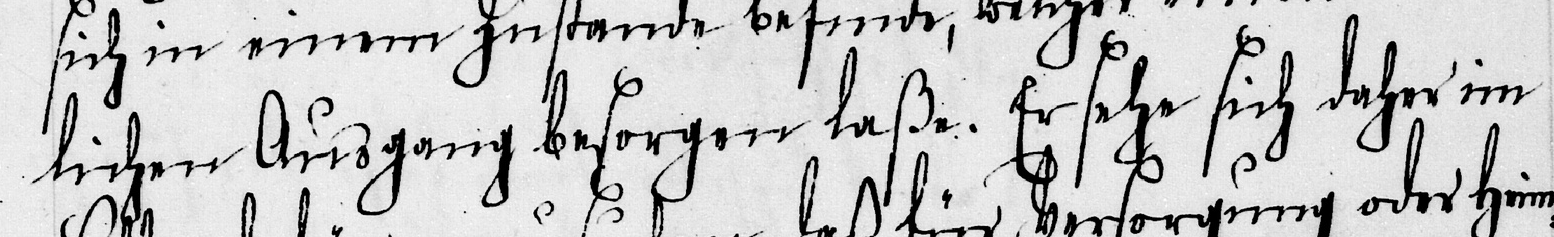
lichen Ausgang besorgen laße. Er sehe sich daher im
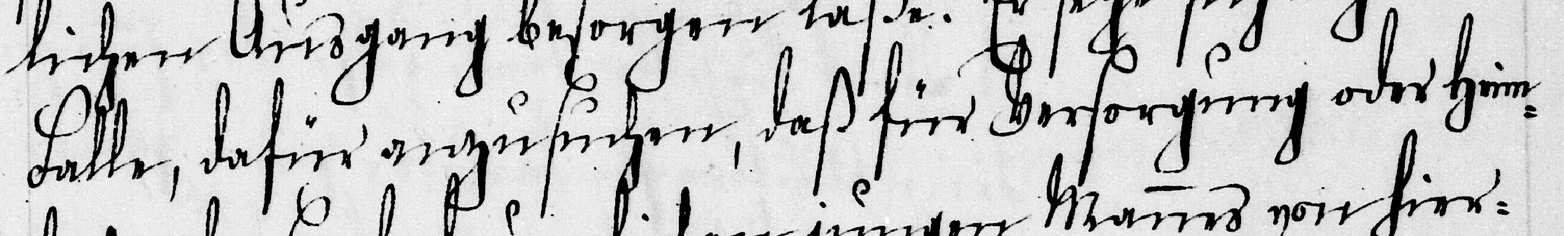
Falle, dafür anzusuchen, daß für Versorgung oder Heim¬
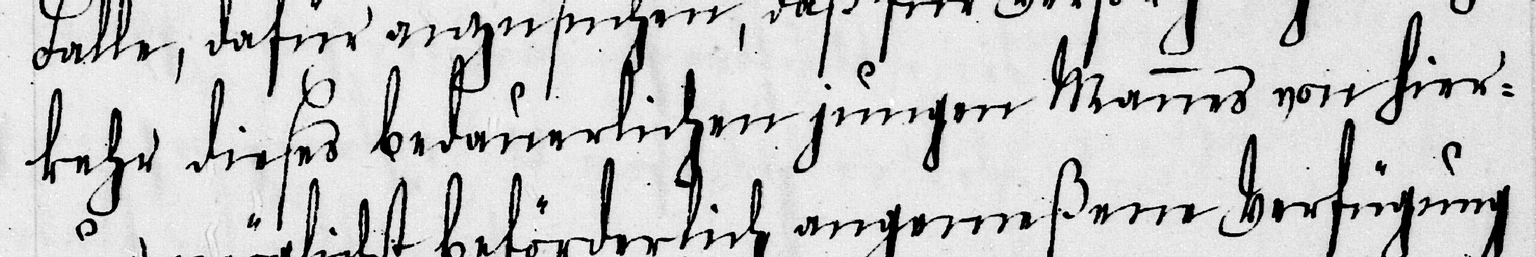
kehr dieses bedauerlichen jungen Mannes von hier¬
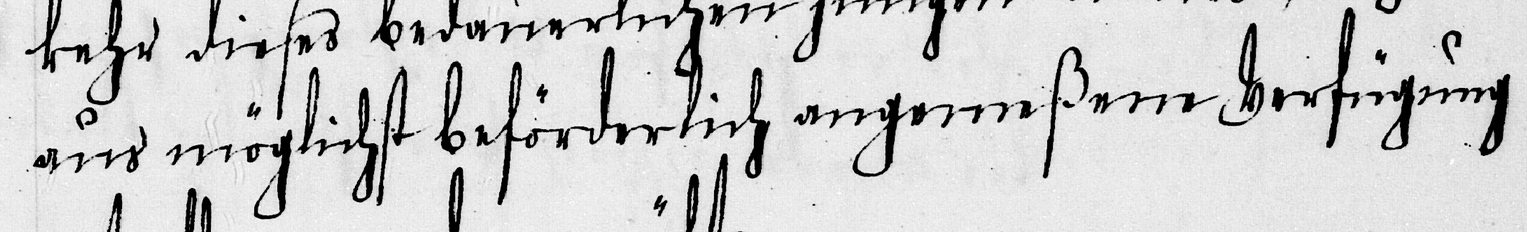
aus möglichst beförderlich angemeßene Verfügung
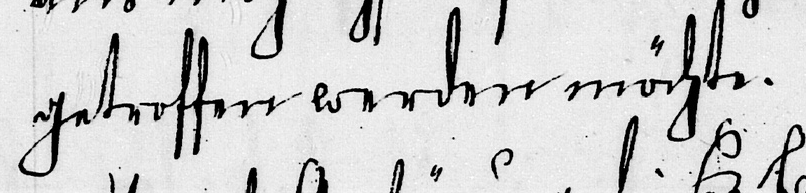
getroffen werden möchte.
